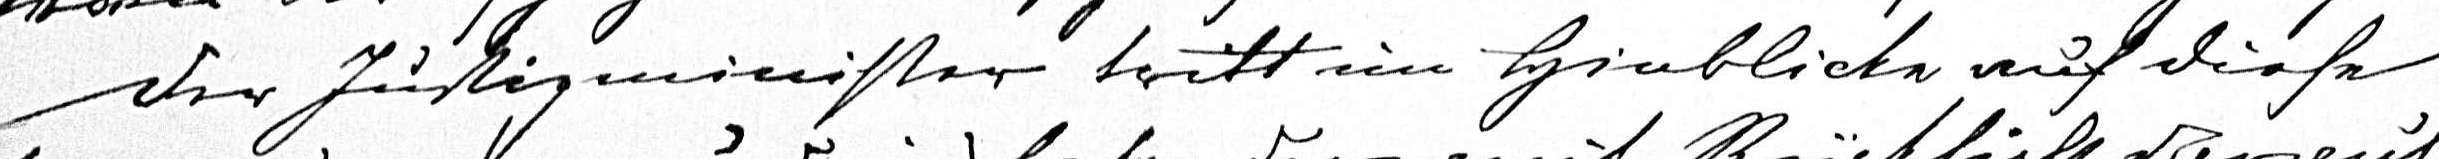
Der Justizminister tritt im Hinblicke auf diese
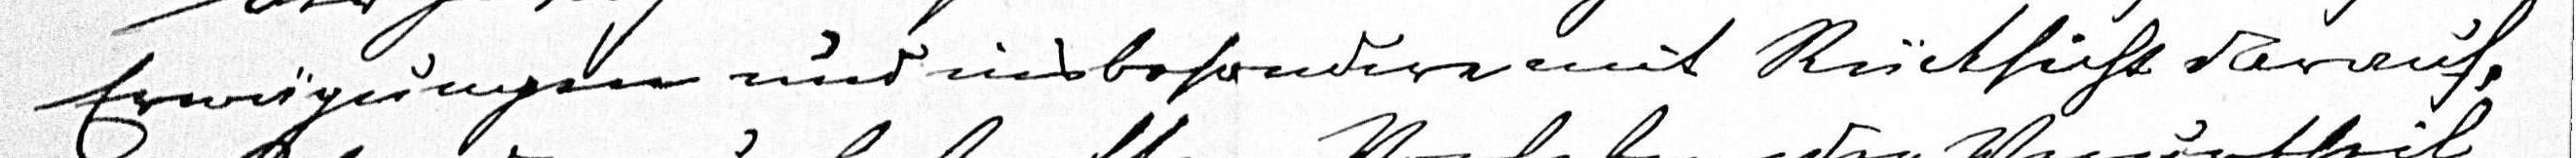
Erwägungen und insbesondere mit Rücksicht darauf,
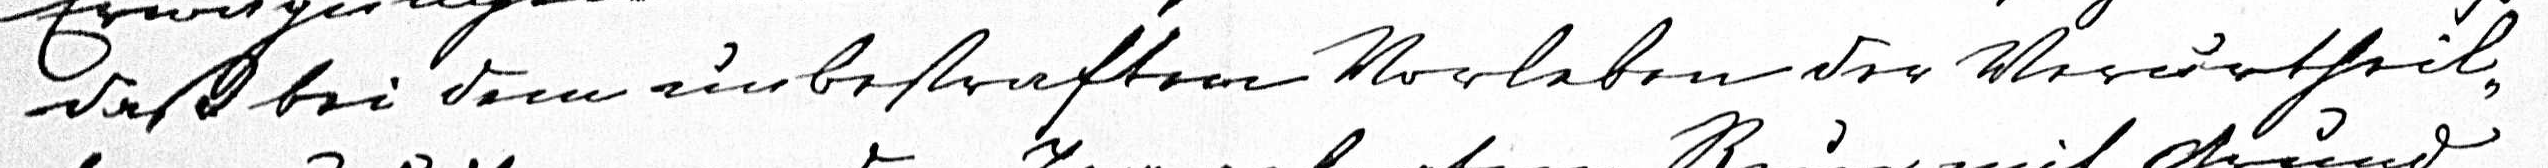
daß bei dem unbestraften Vorleben der Verurtheil¬
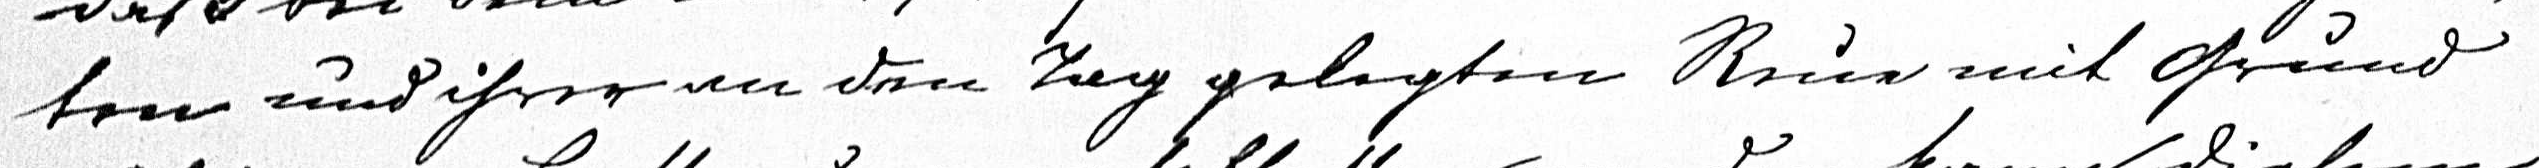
ten und ihrer an den Tag gelegten Reue mit Grund
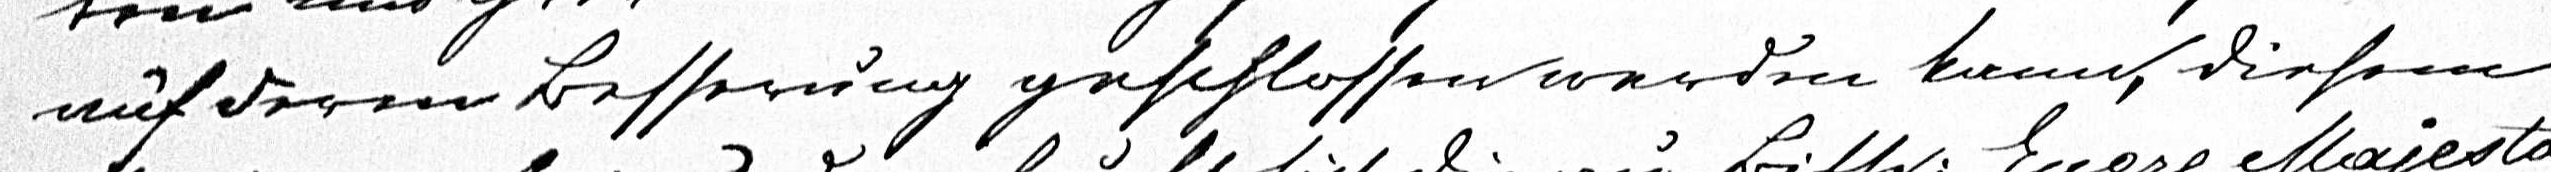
auf deren Besserung geschlossen werden kann, diesem
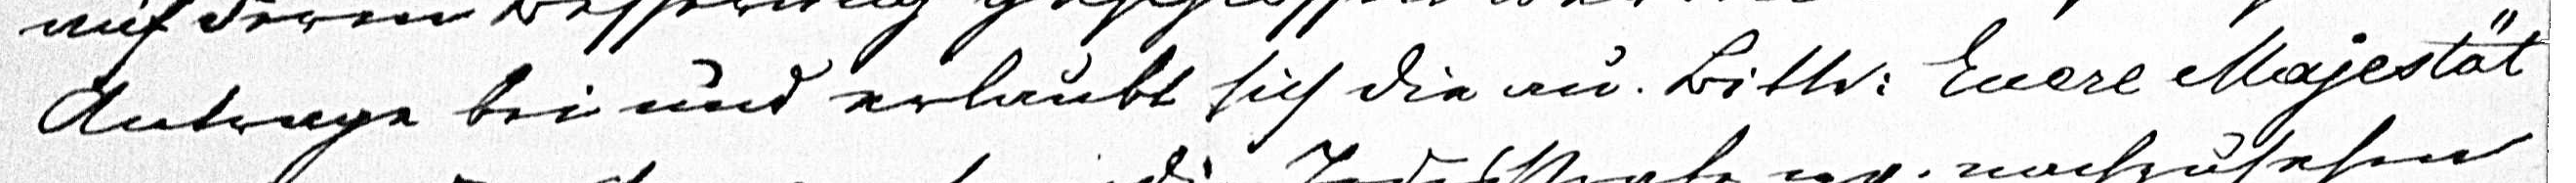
Antrage bei und erlaubt sich die au. Bitte: Euere Majestät
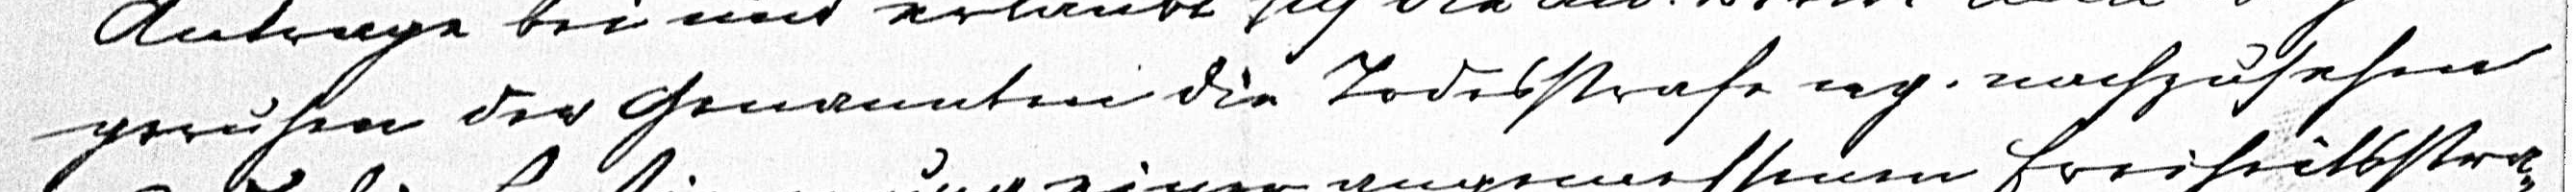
geruhen den Genannten die Todesstrafe ag. nachzustehen
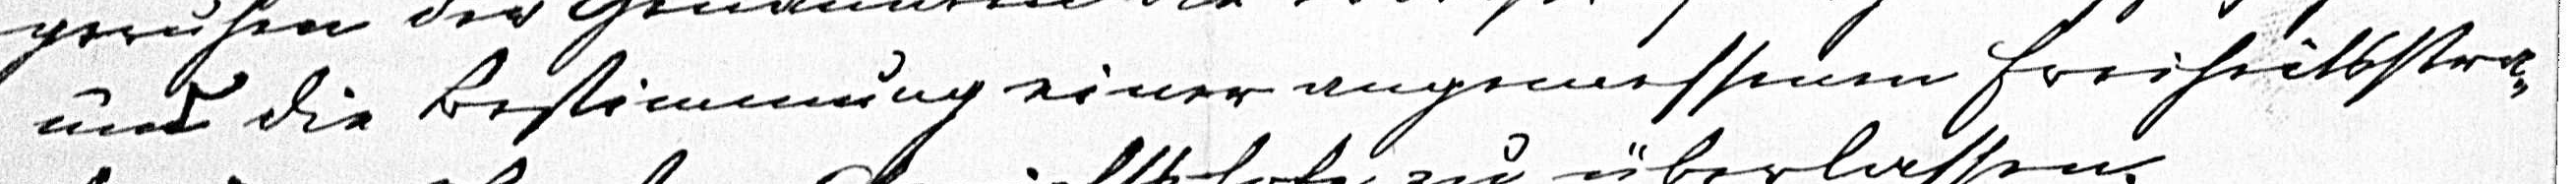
und die Bestimmung einer angemessenen Freiheitsstra¬
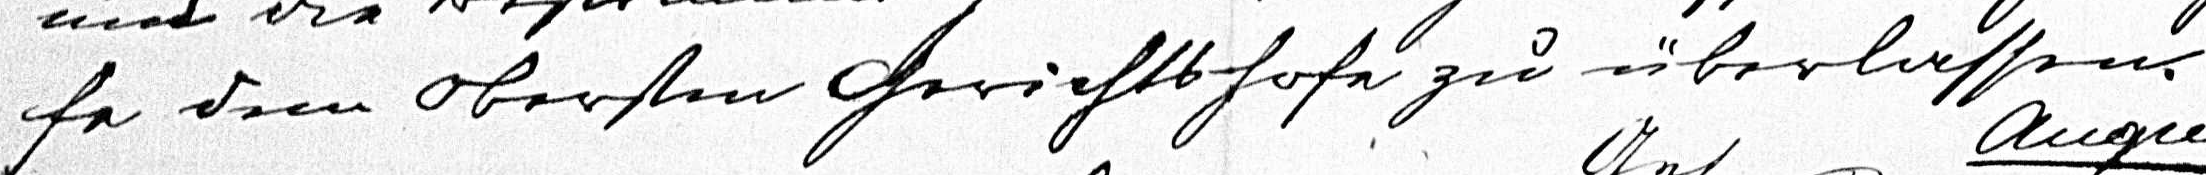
fe dem Obersten Gerichtshofe zu überlassen.
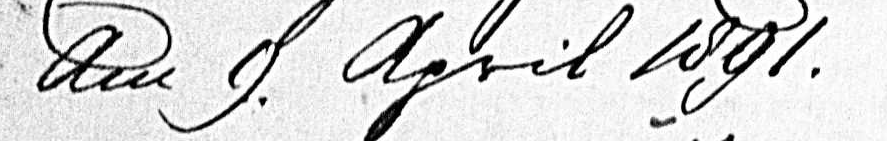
Am 9. April 1891
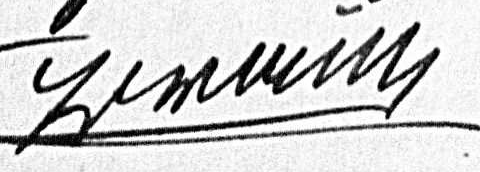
Wraun
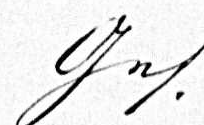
Ges.
